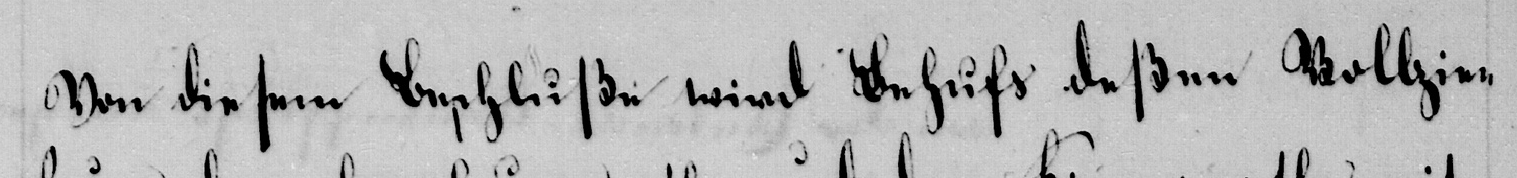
Von diesem Beschluße wird Behufs deßen Vollzie¬
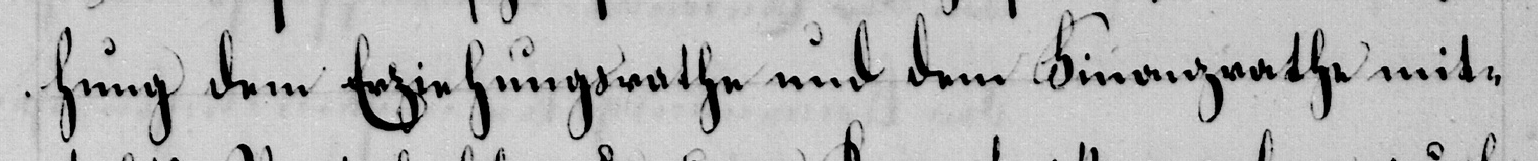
hung dem Erziehungsrathe und dem Finanzrathe mit¬
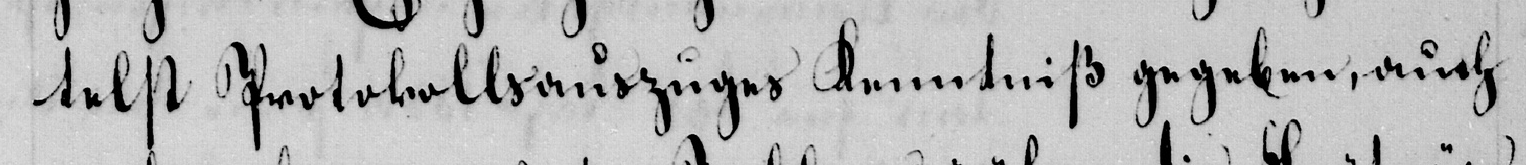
telst Protokollsauszuges Kenntniß gegeben, auch
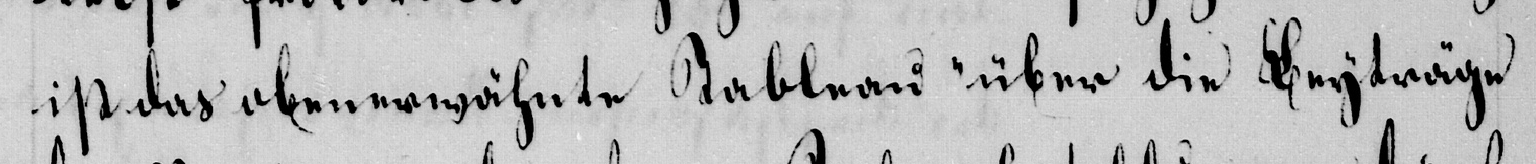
ist das obenerwähnte Tableau über die Beyträge
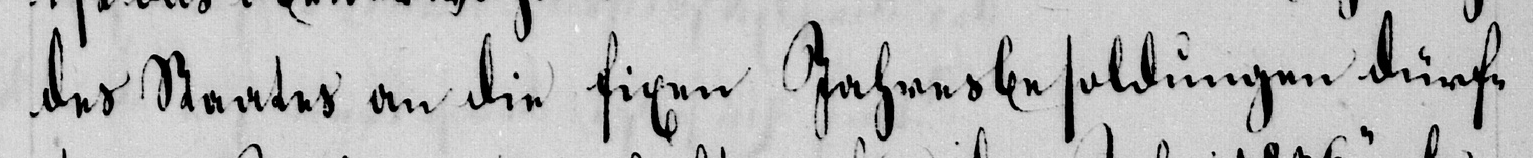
des Staates an die fixen Jahresbesoldungen dürf¬
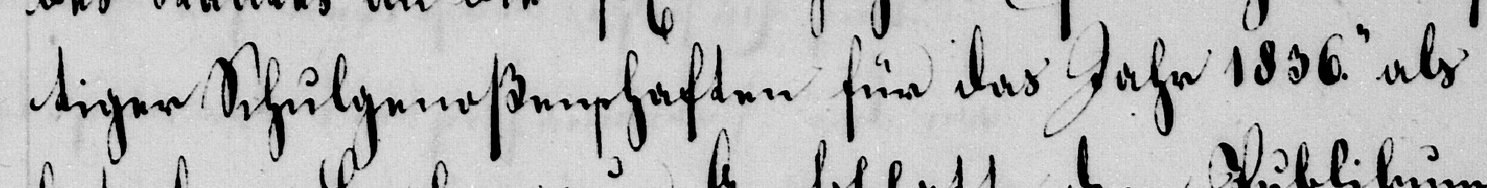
tiger Schulgenoßenschaften für das Jahr 1836. als
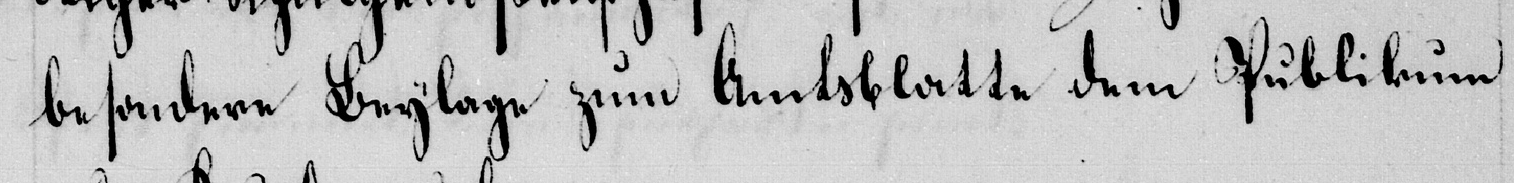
besondere Beylage zum Amtsblatte dem Publikum
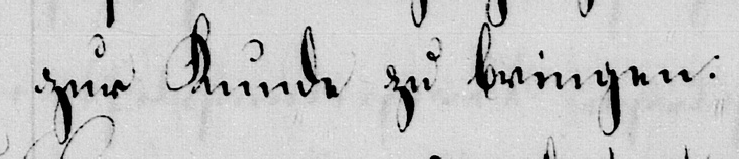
zur Kunde zu bringen.
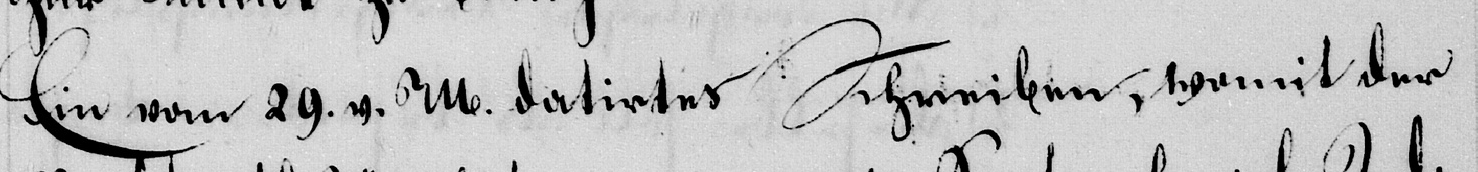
Ein vom 29. v. M. datirtes Schreiben, womit der
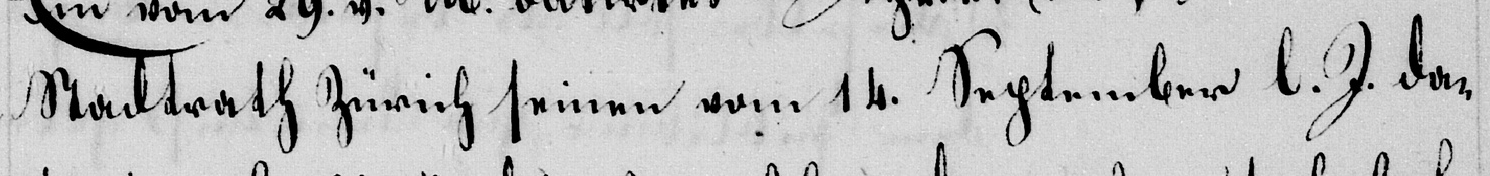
Stadtrath Zürich seinen vom 14. September l. J. da¬
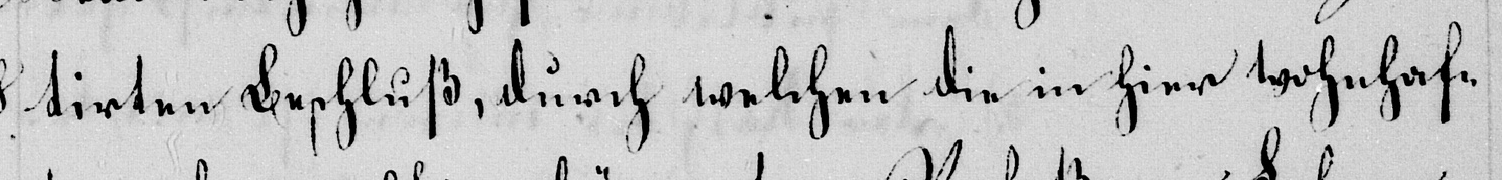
tirten Beschluß, durch welchen die in hier wohnhaf¬
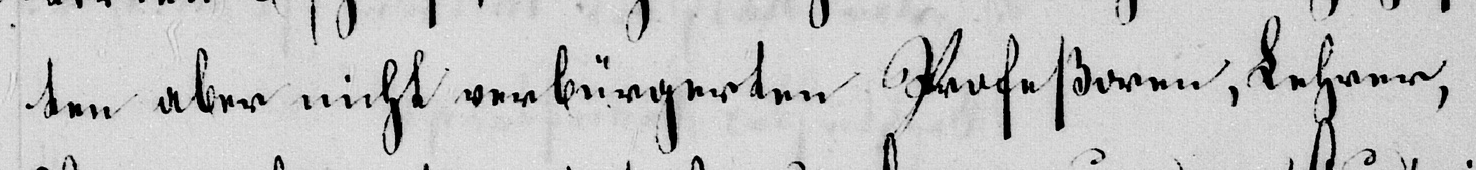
ten aber nicht verbürgerten Profeßoren, Lehrer,
